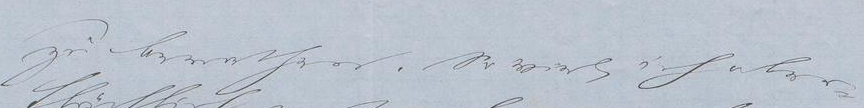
zu berathen. So viel ich ober-
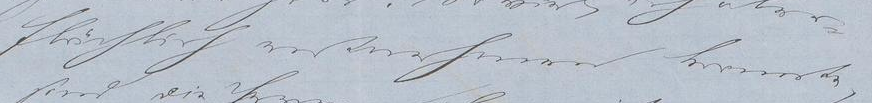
flächlich vernehmen konnte,
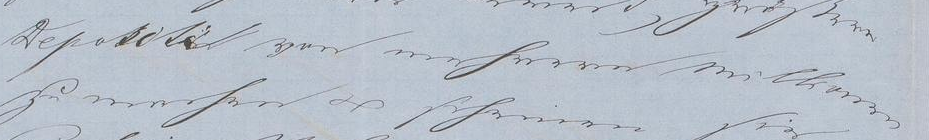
Deposita von mehrern Millionen
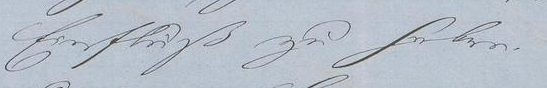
Einfluß zu haben.
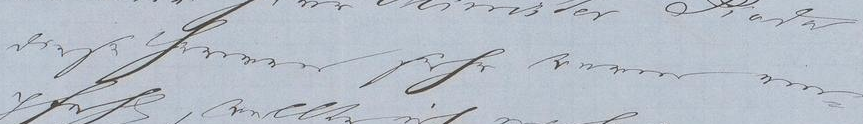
diese Herren sehr warm em-
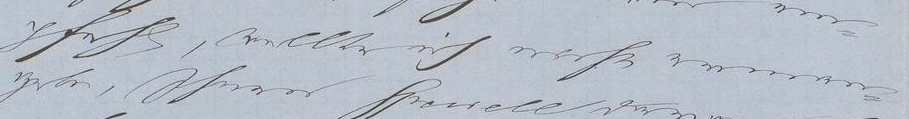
pfahl, wollte ich nicht erman-
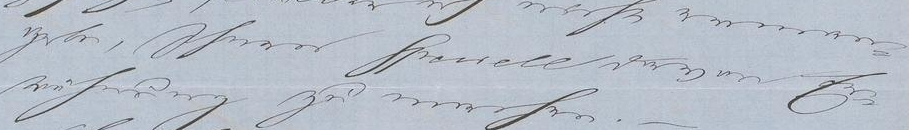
geln, Ihnen speciell davon Er-
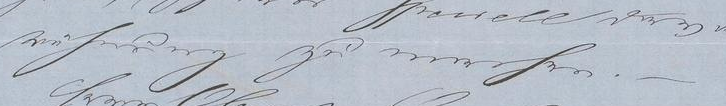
wähnung zu machen. –
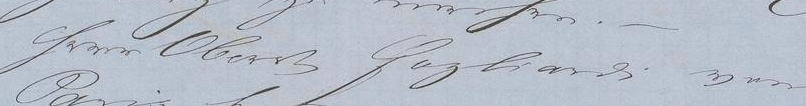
Herr Oberst Fazliardi von
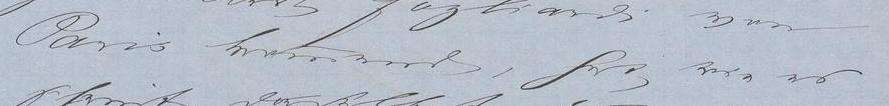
Paris kommend, hat, wie es
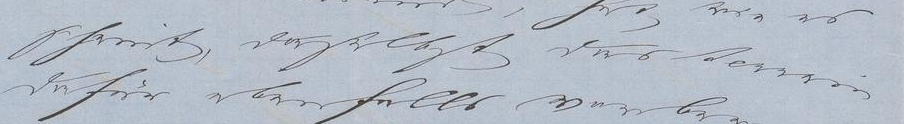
scheint, daselbst das terrain
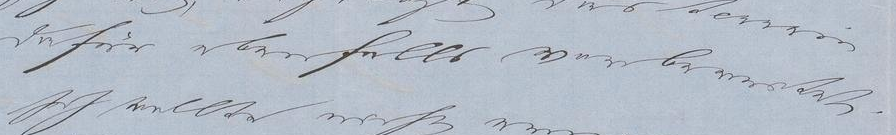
dafür ebenfalls vorbereitet.
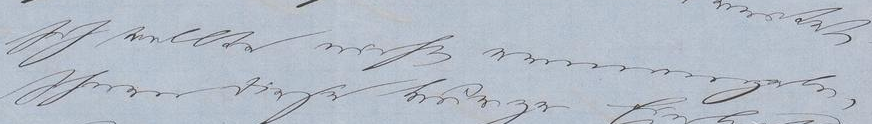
Ich wollte nicht ermangeln,
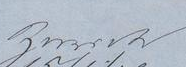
Zürich
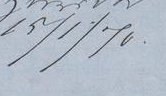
15/1/70.
